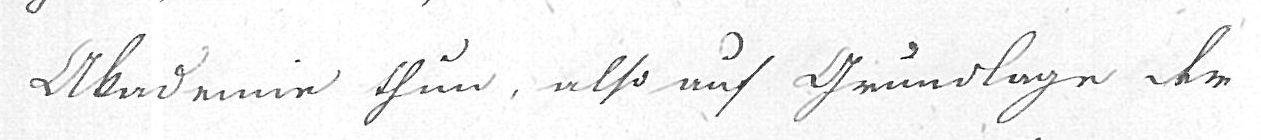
Akademie thun, also auf Grundlagen der
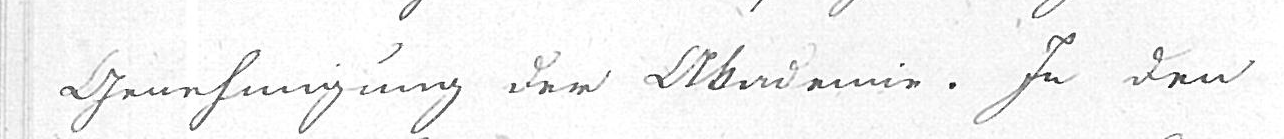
Genehmigung der Akademie. In den
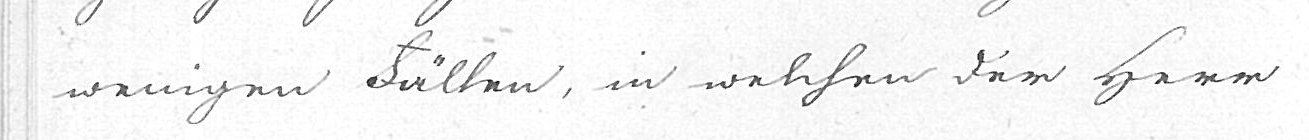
wenigen Fällen, in welchen der Herr
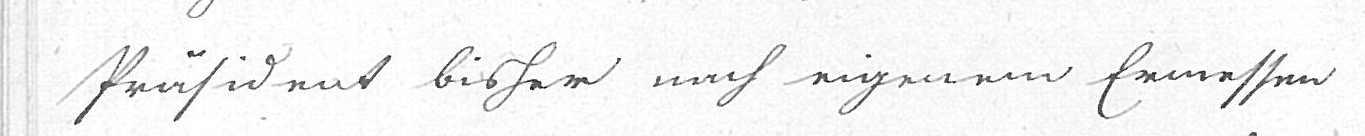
Präsident bisher nach eigenem Ermessen
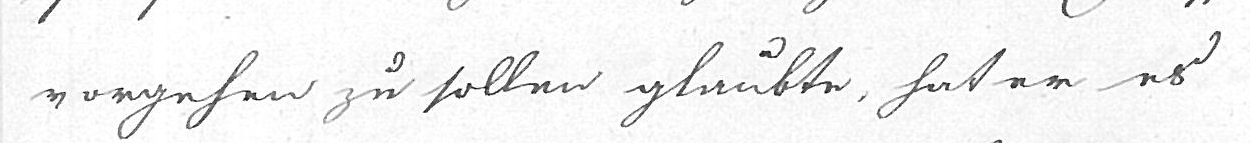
vorgehen zu sollen glaubte, hat er es
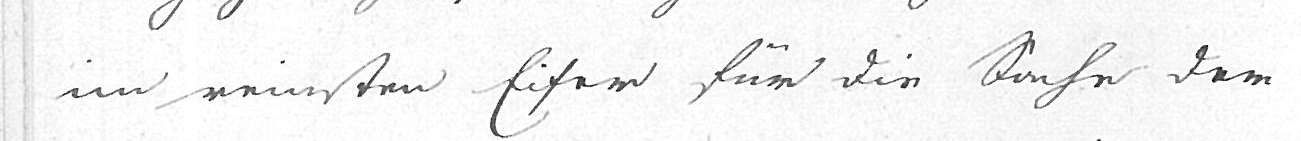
im reinsten Eifer für die Sache der
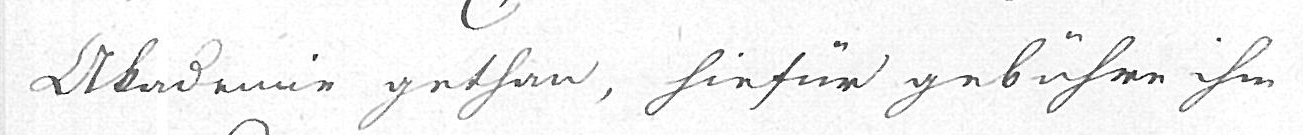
Akademie gethan, hiefür gebühre ihm
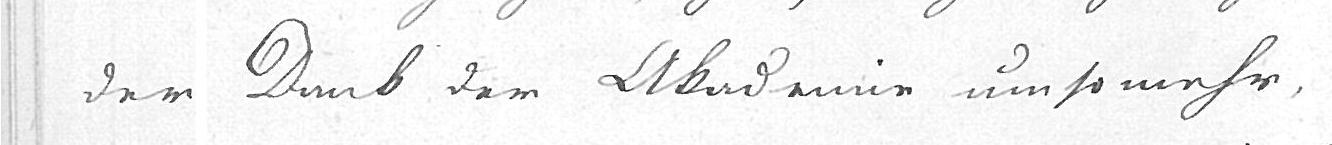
der Dank der Aakdemie umsomehr,
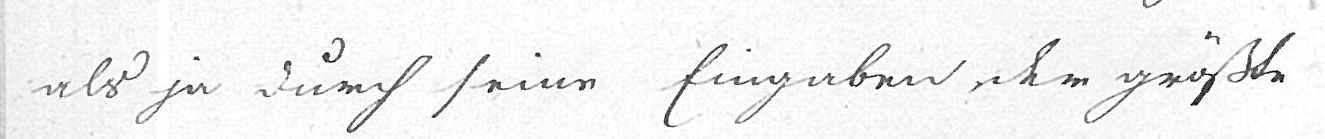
als ja durch seine Eingaben, der größte
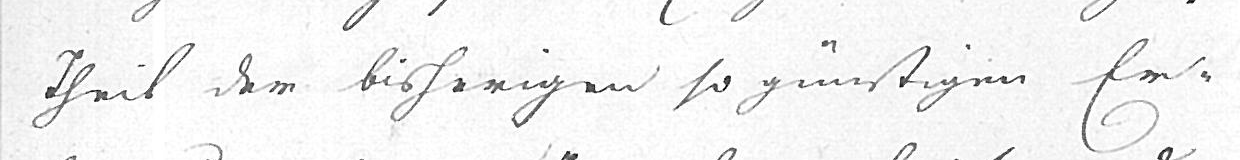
Theil der bisherigen so günstigen Er-
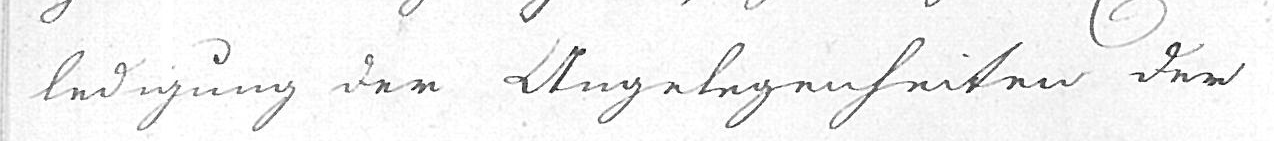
ledigung der Angelegenheiten der
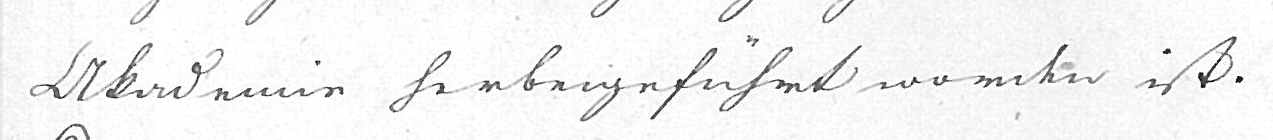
Akademie herbeigeführt worden ist.
